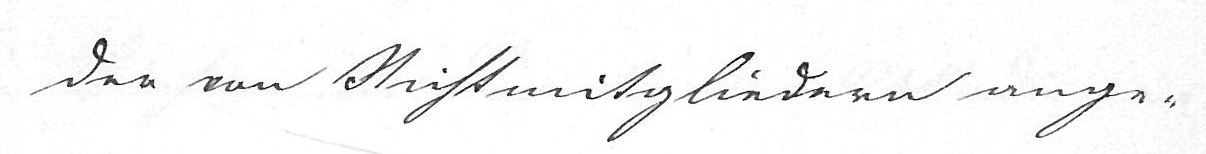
der von Nichtmitgliedern ange-
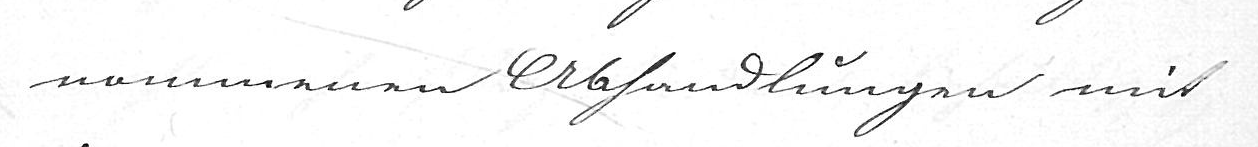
nommenen Abhandlungen mit
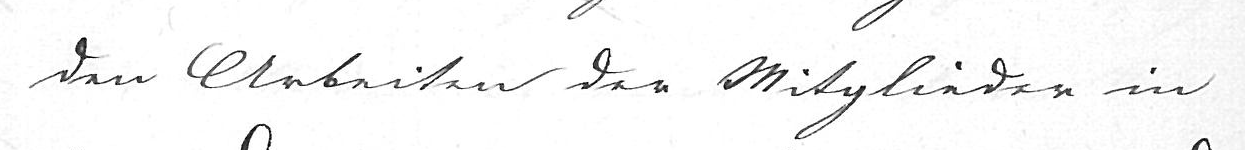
den Arbeiten der Mitglieder in
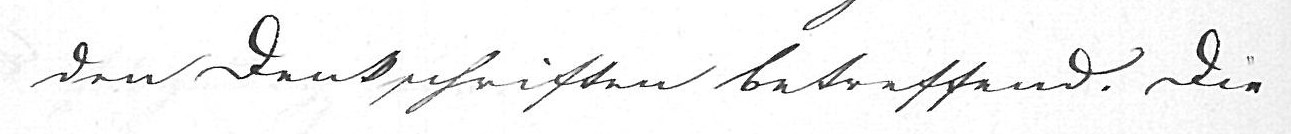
den Druckschriften betreffend. Die
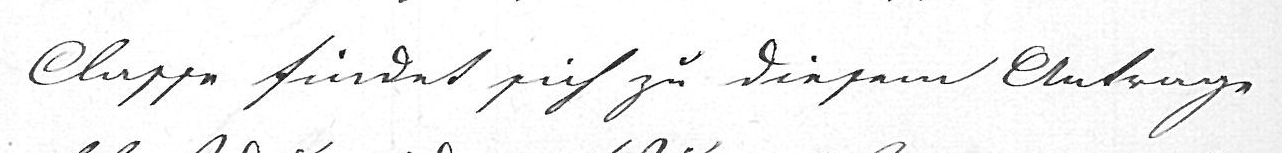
Classe findet sich zu diesem Antrage
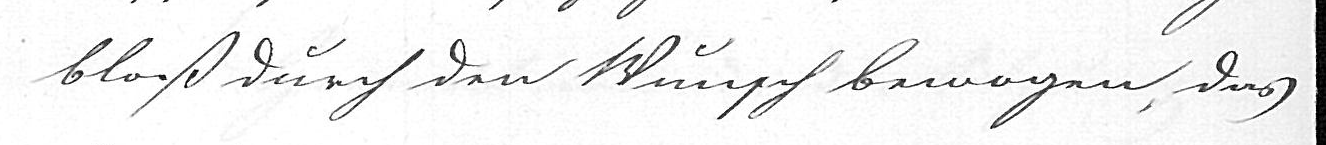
bloß durch den Wunsch bewogen, das
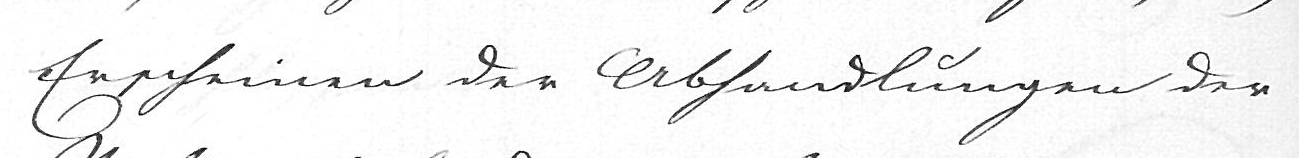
Erscheinen der Abhandlungen der
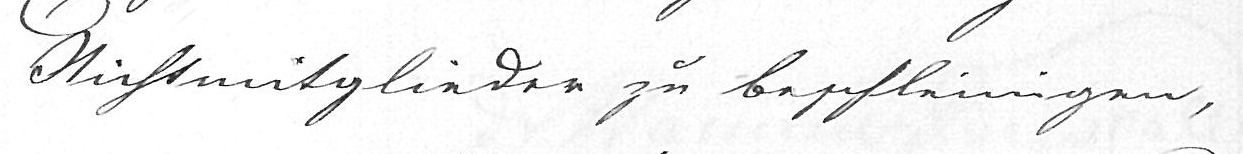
Nichtmitglieder zu beschleunigen,
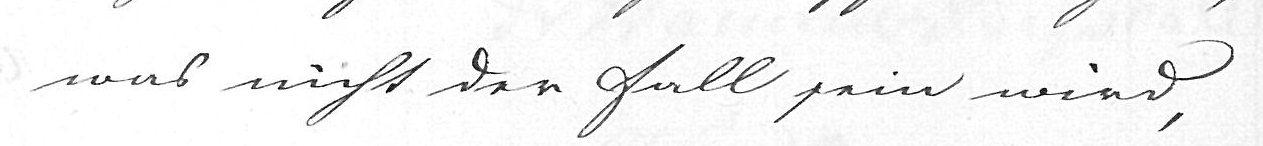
was nicht der Fall sein wird,
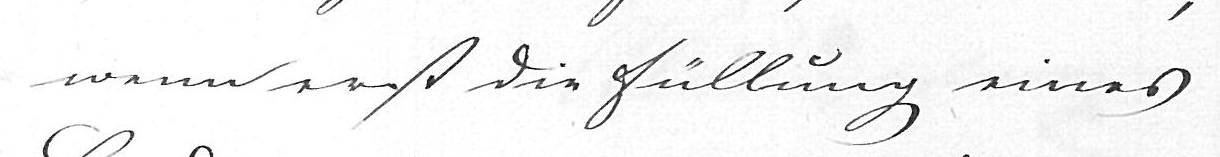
wenn erst die Füllung eines
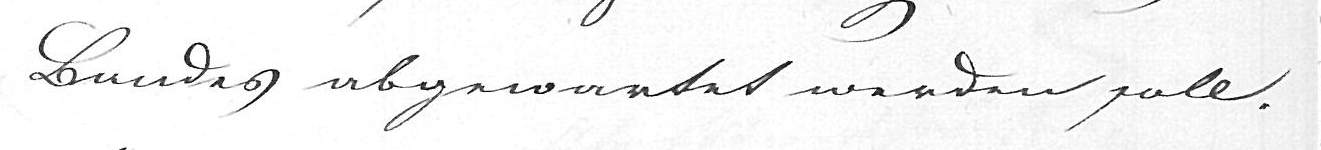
Bandes abgewartet werden soll.
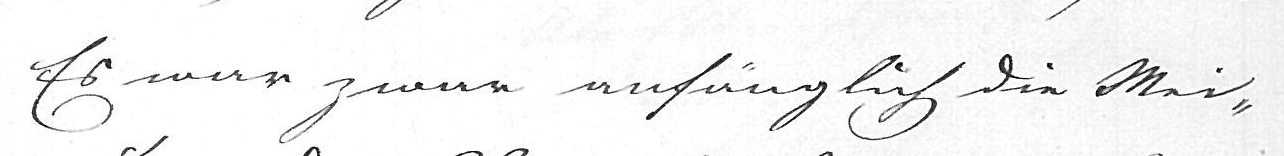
Es war zwar anfänglich der Mei-
